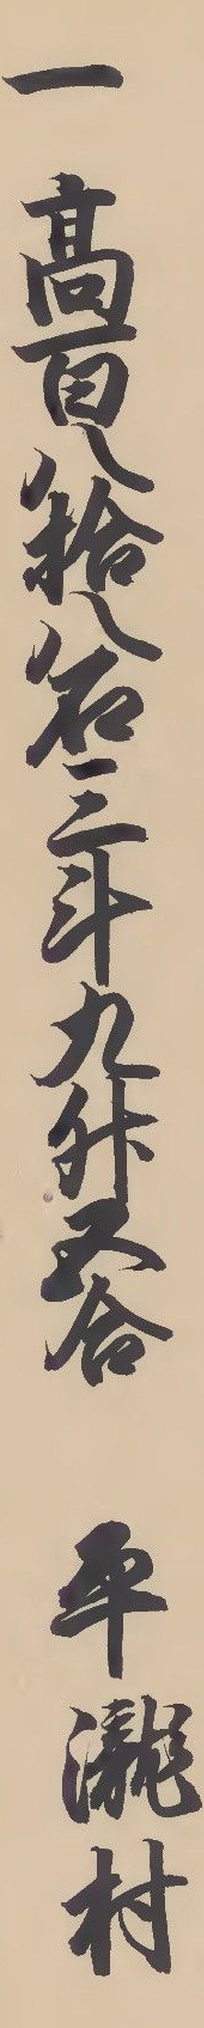一高百八拾八石三斗九升五合平滝村

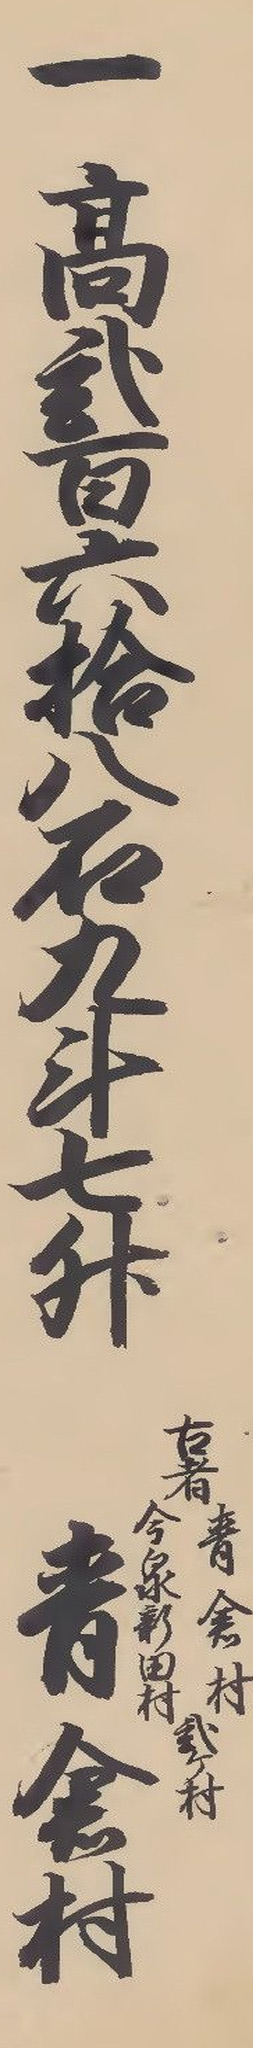一高弐百六拾八石九斗七升青倉村
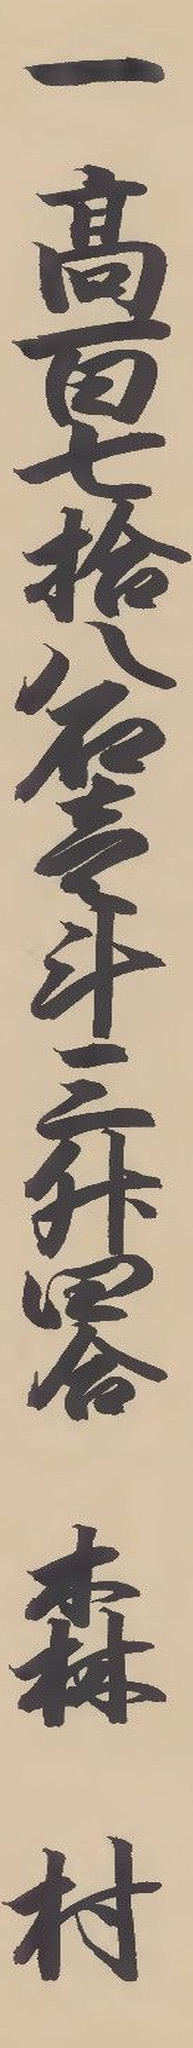一高百七拾八石壱斗三升四合森村
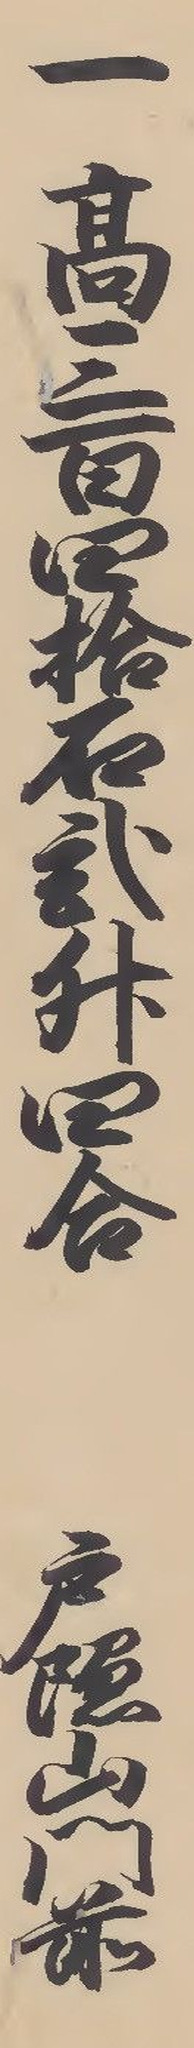一高三百四拾石弐升四合戸隠山門前
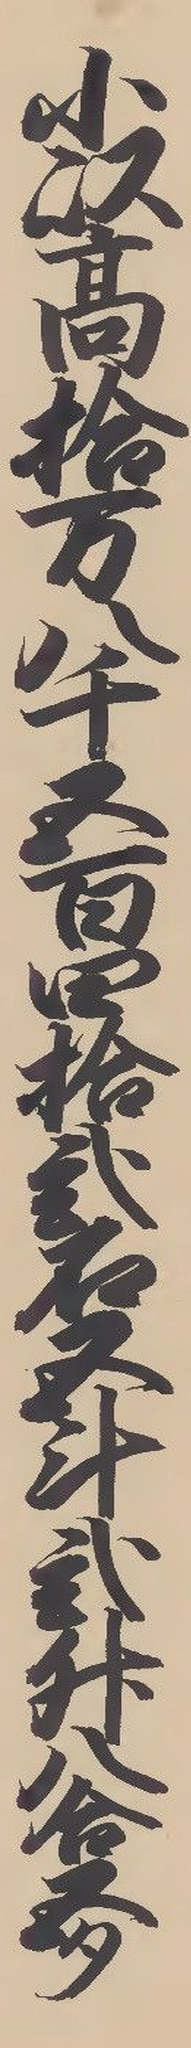小以高拾万八千五百四拾弐石五斗弐升八合五勺

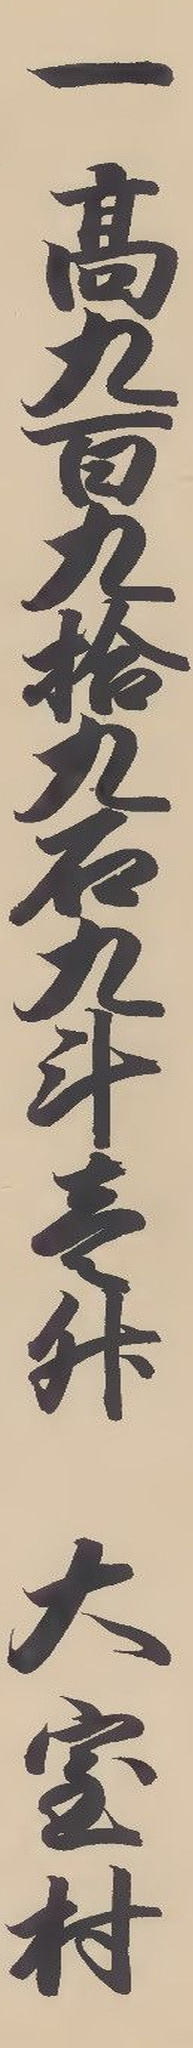一高九百九拾九石九斗壱升大室村
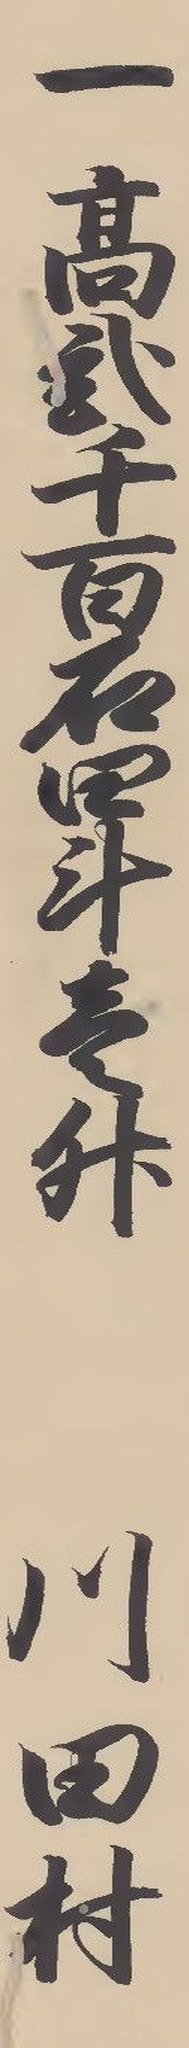一高弐千百石四斗壱升川田村
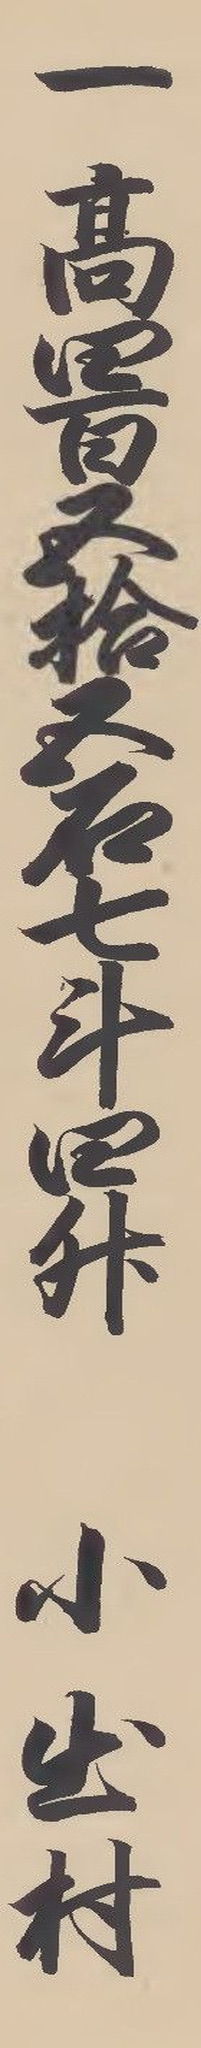一高四百五拾五石七斗四升小出村
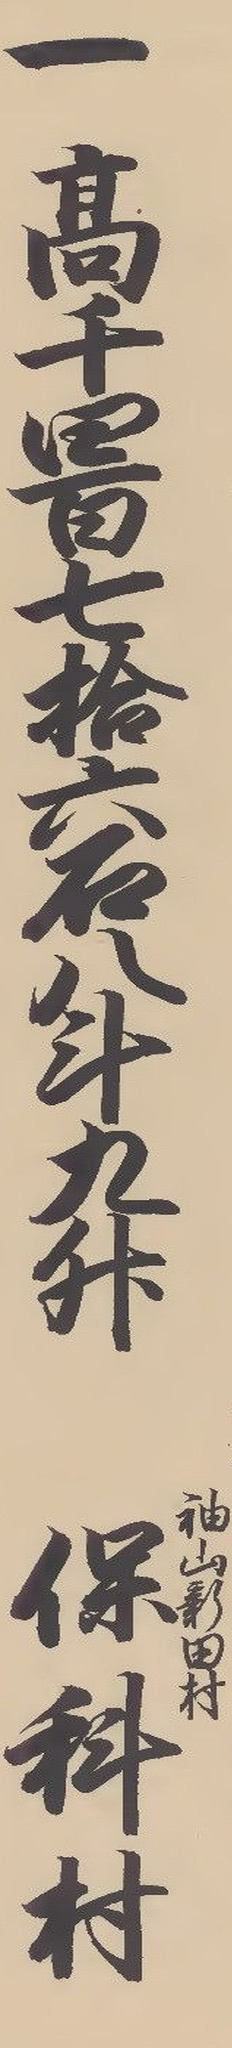一高千四百七拾六石八斗九升保科村
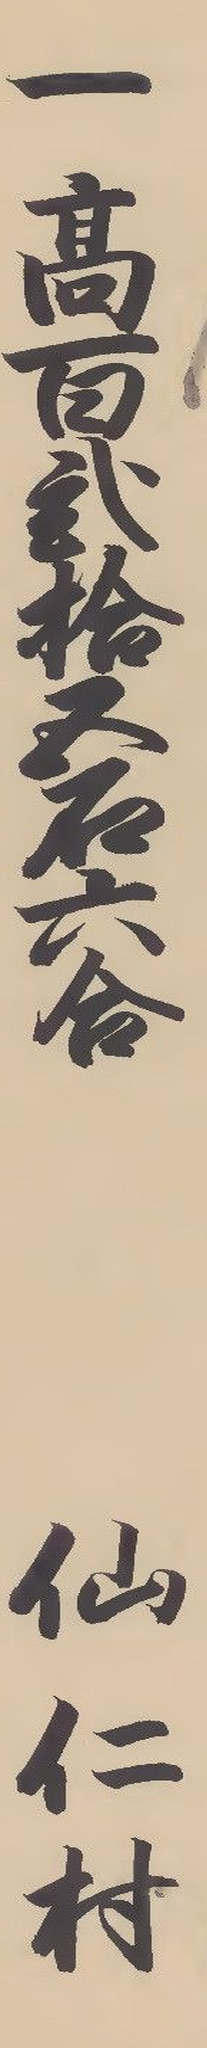一高百弐拾五石六合仙仁村
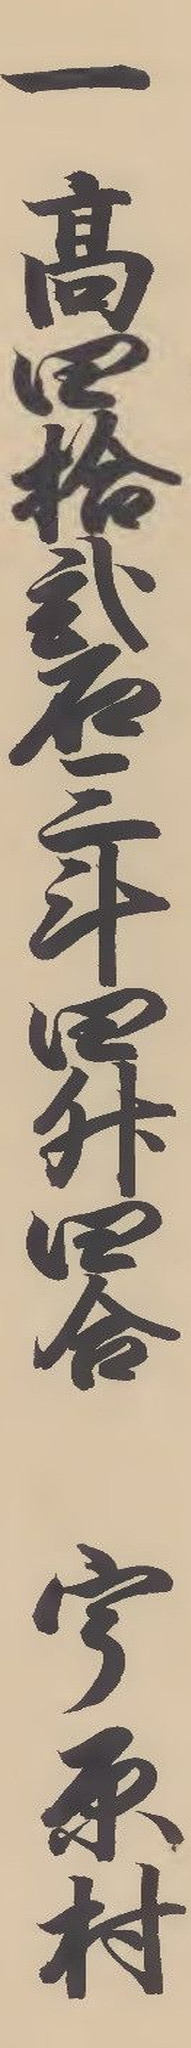一高四拾弐石三斗四升四合宇原村
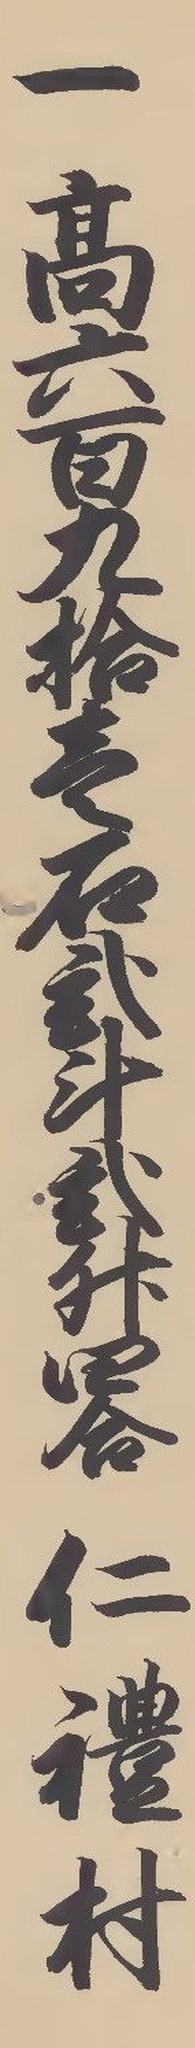一高六百九拾壱石弐斗弐升四合仁礼村

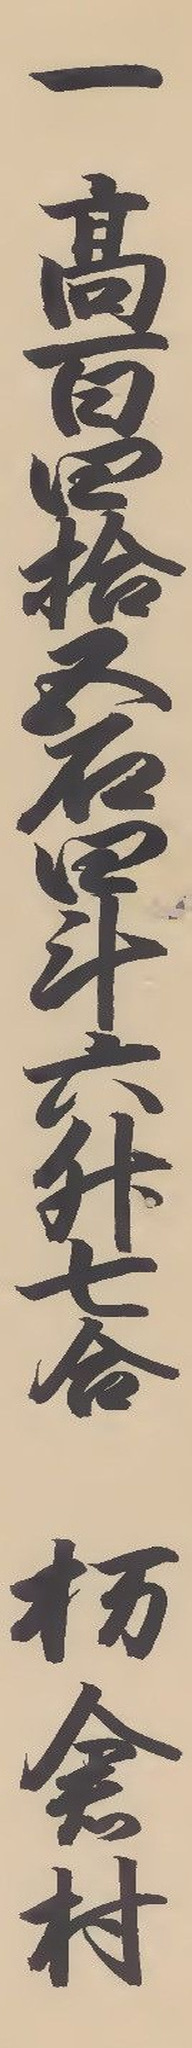一高百四拾五石四斗六升七合栃倉村
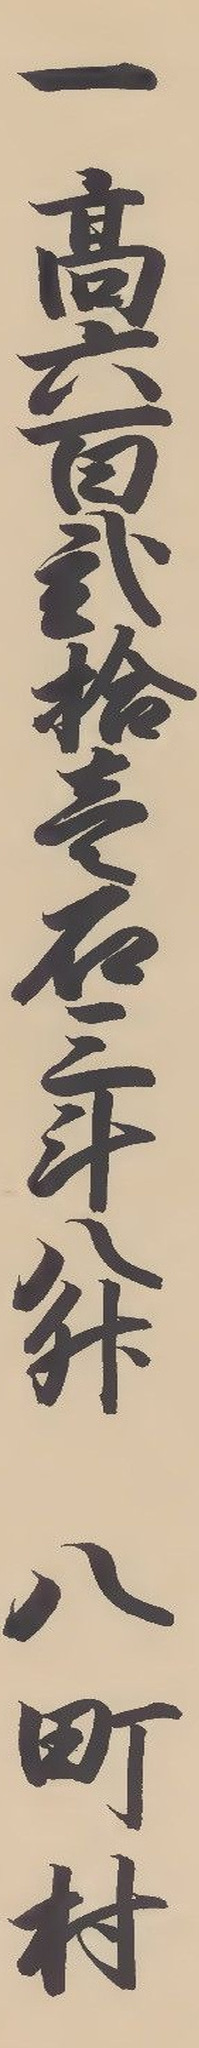一高六百弐拾壱石三斗八升八町村
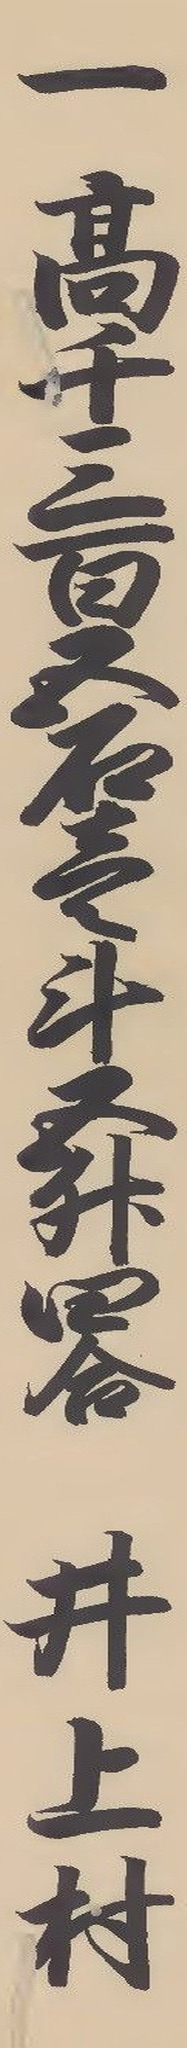一高千三百五石壱斗五升四合井上村
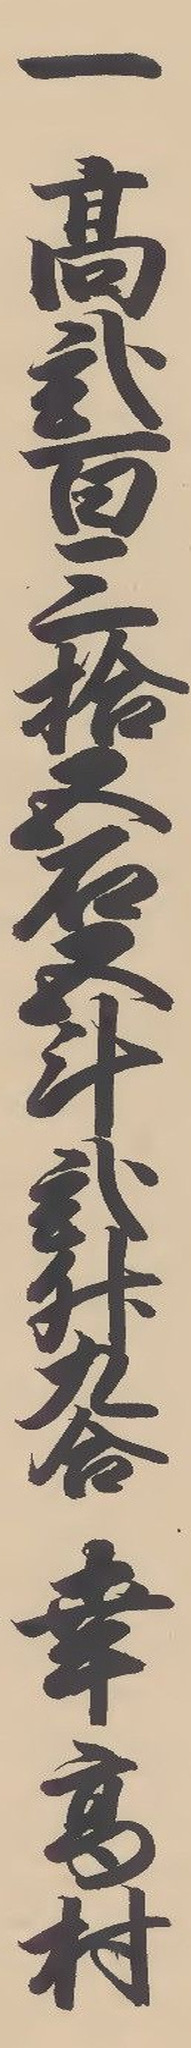一高弐百三拾五石五斗弐升九合幸高村
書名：信濃国郷帳
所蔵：国立公文書館 National Archives of Japan
